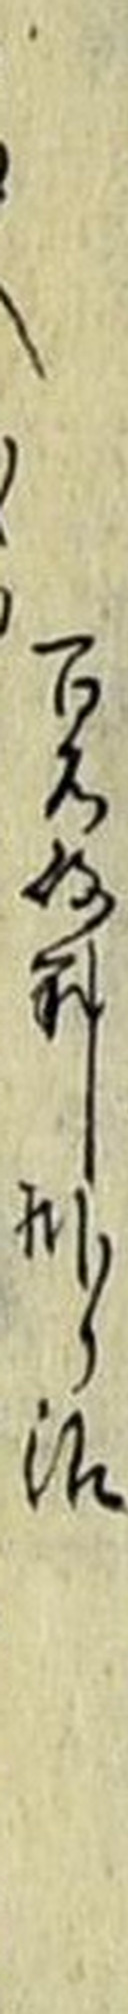百石役料掛り銀
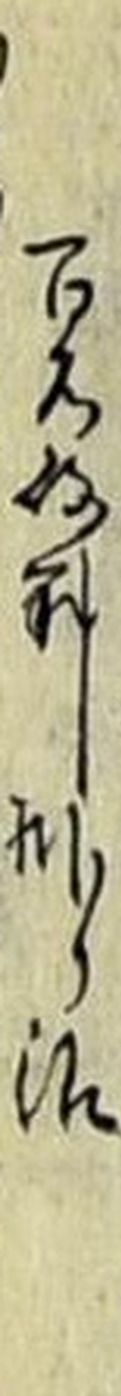百石役料掛り銀
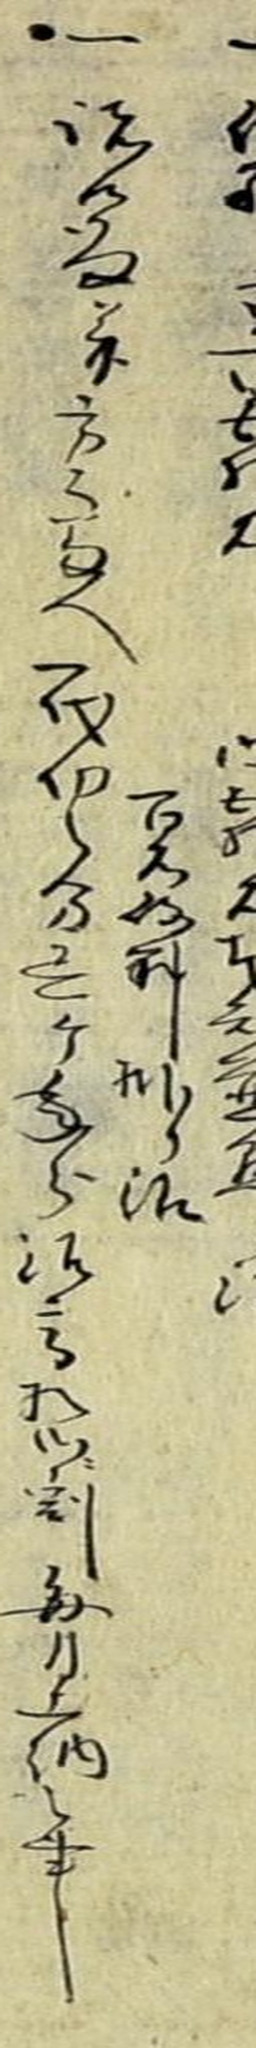一諸御番并方々番人一代切之分壱ヶ年分銀高拾弐に割毎月上納之事
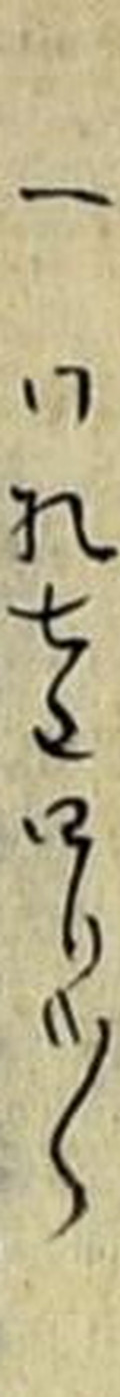一同拾七匁四分弐厘
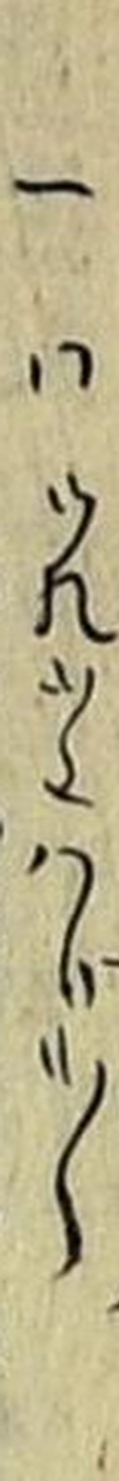一同弐拾弐匁八分弐厘
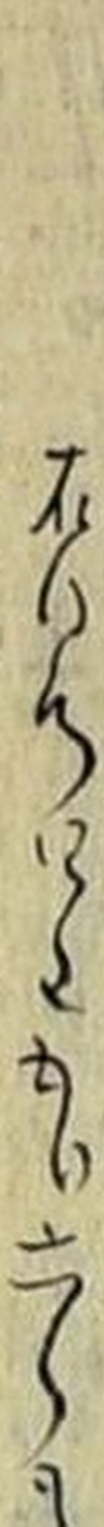右同断四匁五分六厘
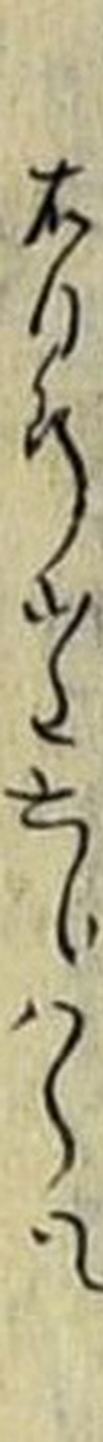右同断弐匁六分七厘
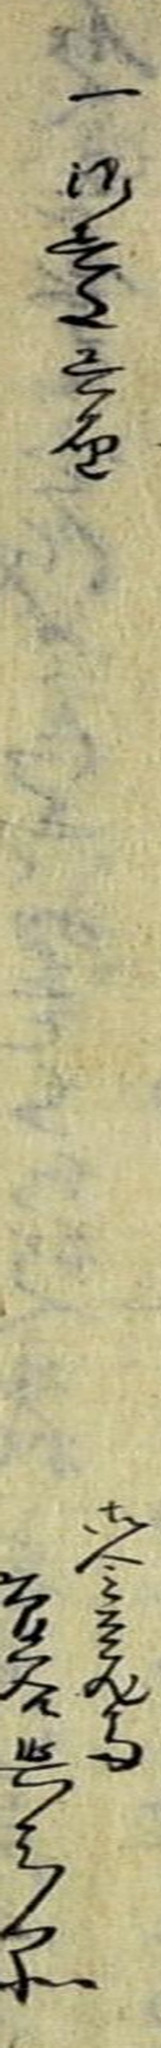一銀壱匁壱厘御金土蔵番
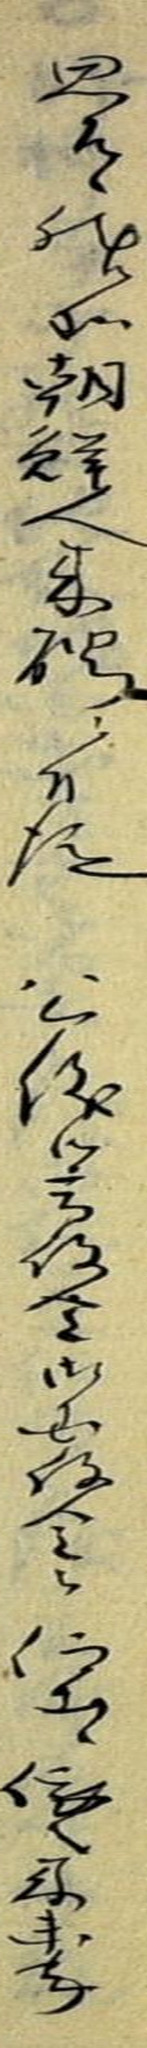思召候然ル処朝鮮人來聘に付従公儀御高役金御国役金被仰出候依之來未年
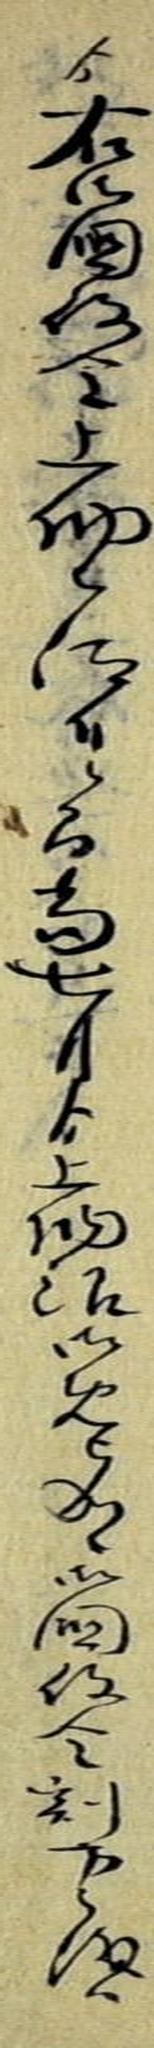ゟ右御国役金上納被仰付候間当七月ゟ上納銀御免被成候御国役金割方之儀は
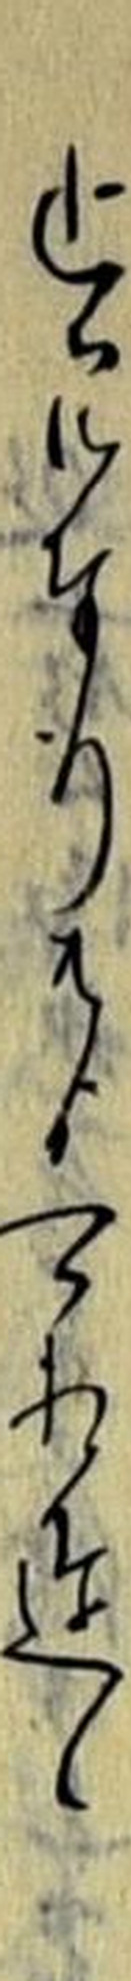追而御奉行共ゟ可相達候
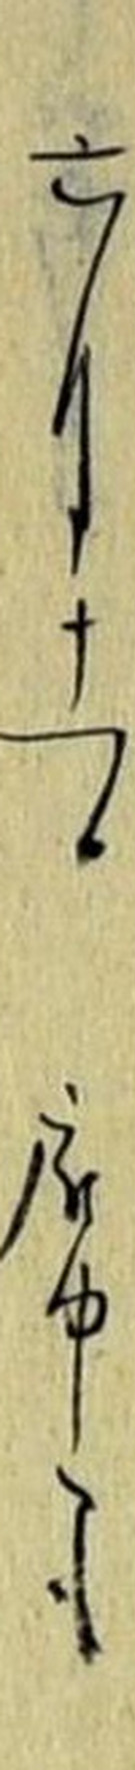六月十一日府中へも
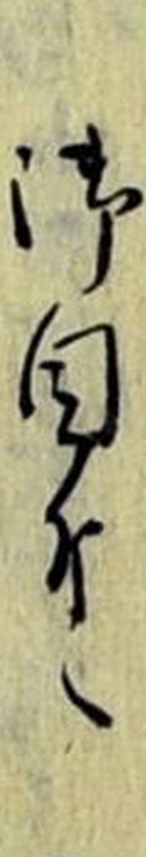御目付へ
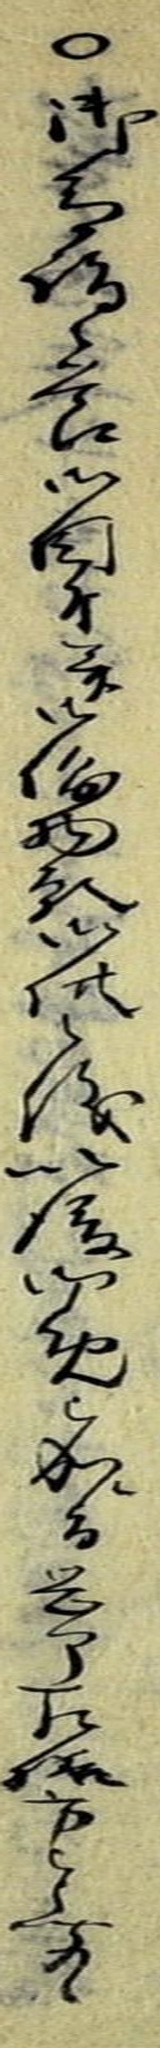○御普請之節御目付共并御側物頭御供之儀以後御免被成候間岡部左膳方被申聞候
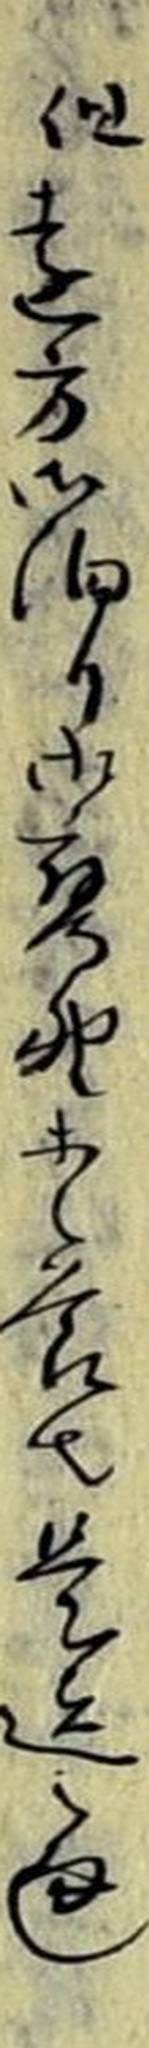但遠方御泊り御鷹野等之節は是迄之通
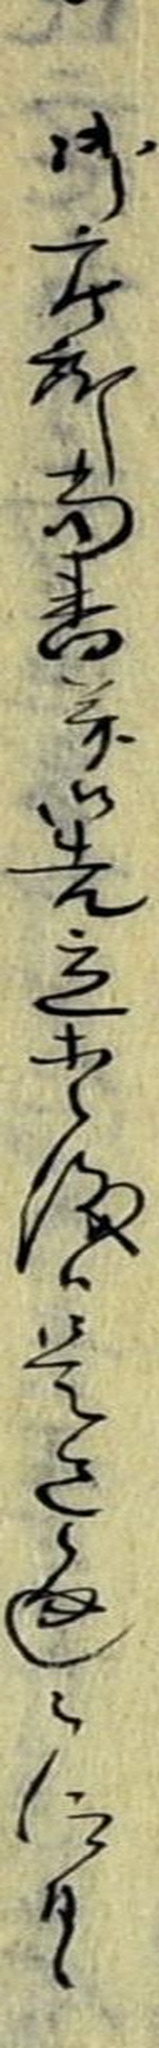御座所当番并御先立等之儀は是迄之通被仰付候
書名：命令之部 四
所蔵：福井県文書館 Fukui Prefectural Archives
